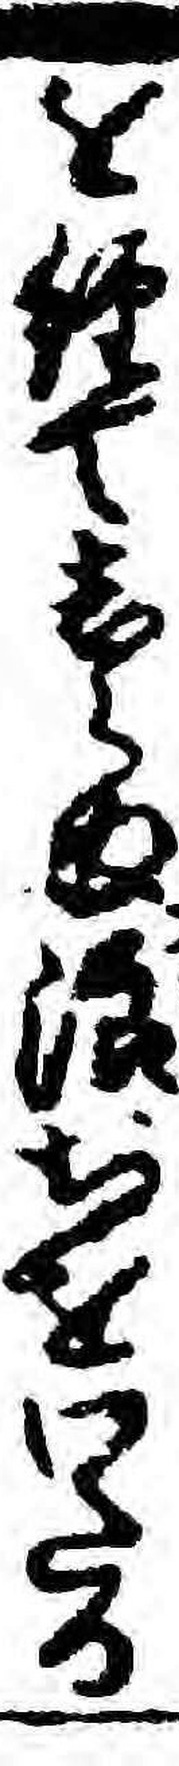を経てしらぬ浪ちをわたる
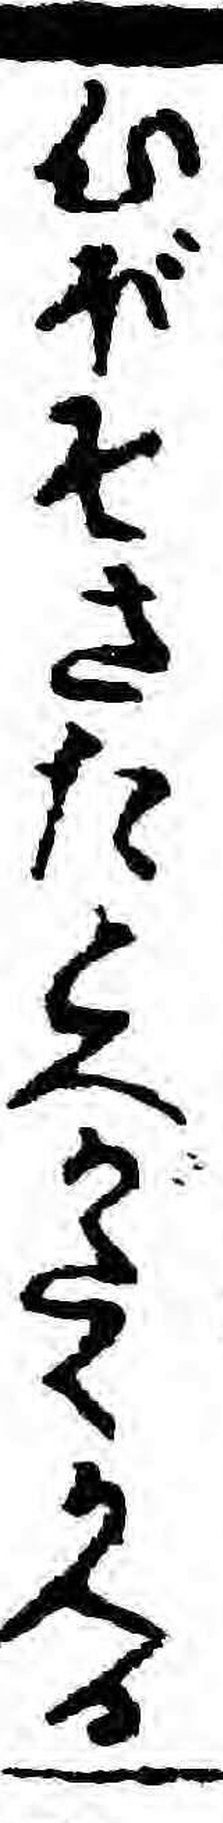心ぼそさたとへがたくかへる
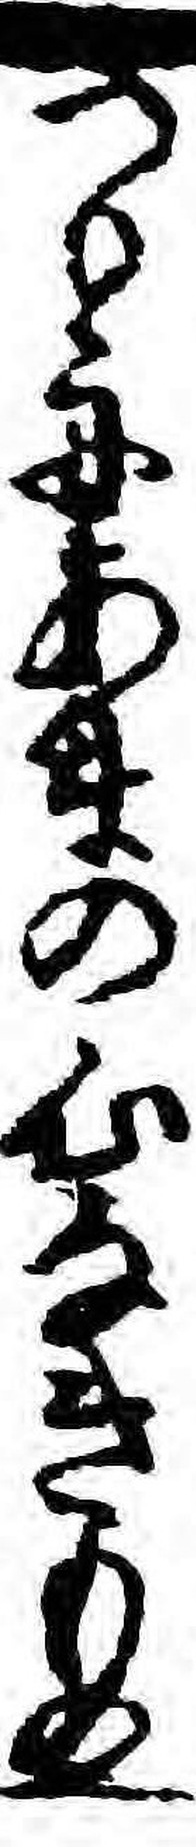つり舟あまの心なきもの
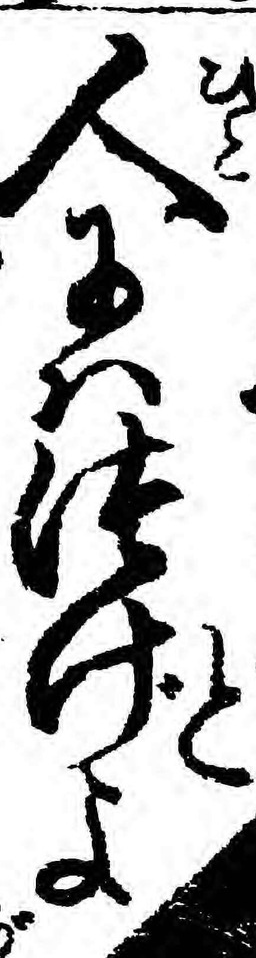人にはつげよ
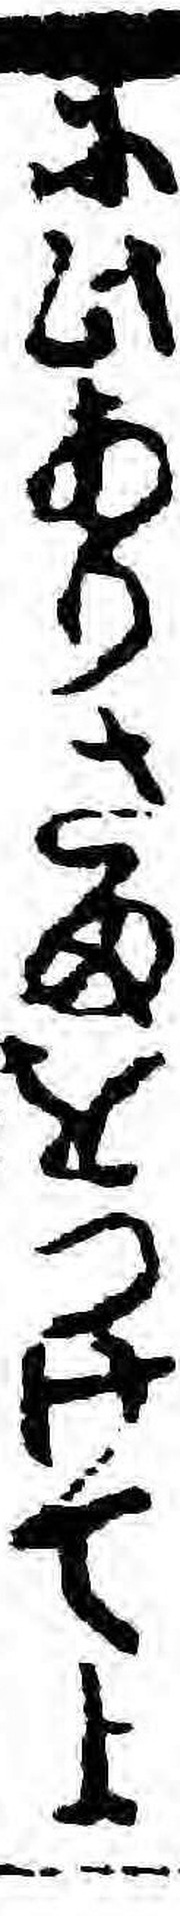に此ありさまをつけてよ
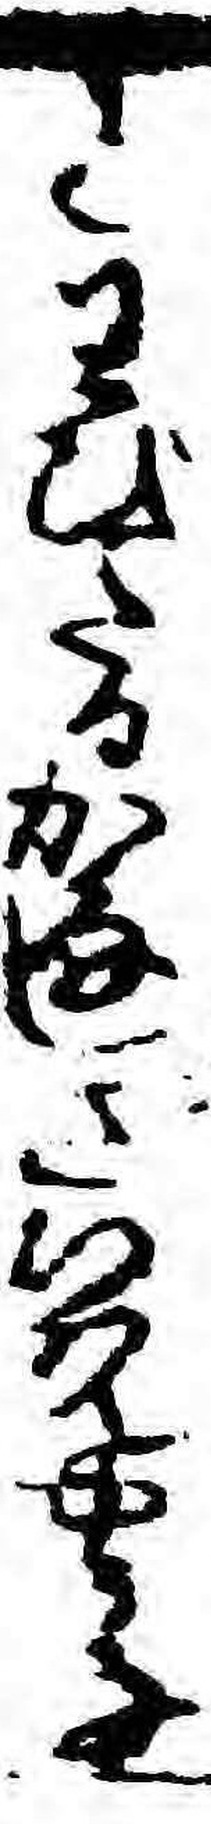とわびたるかなしさいはんやうな
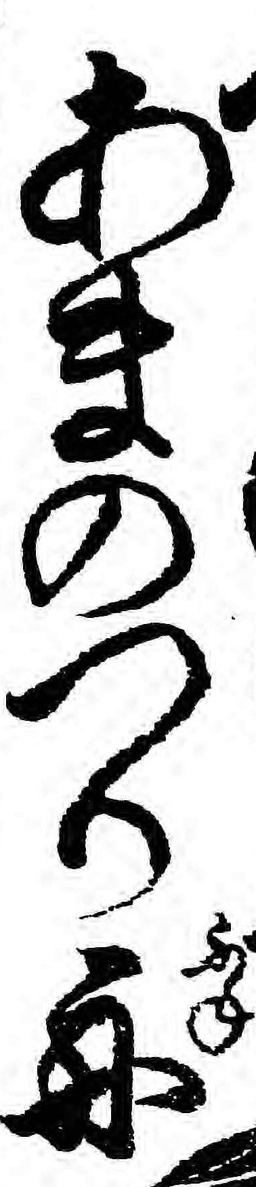あまのつり舟

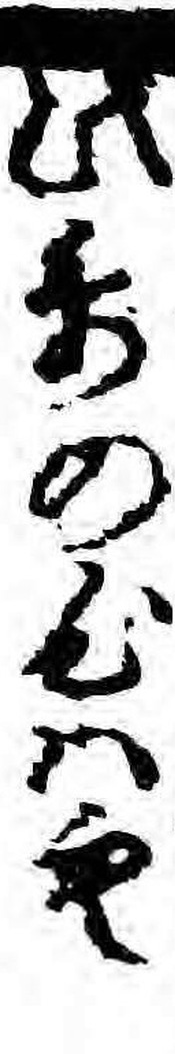此哥の心は空
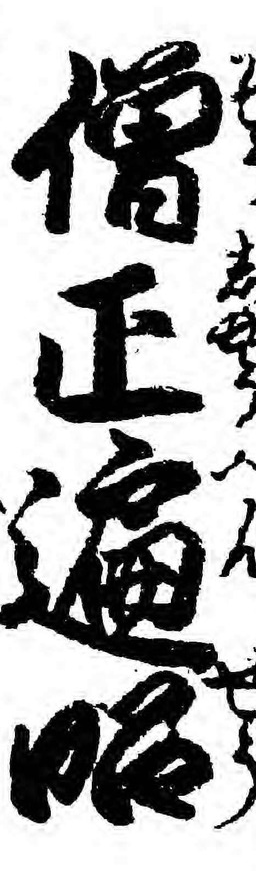僧正遍昭
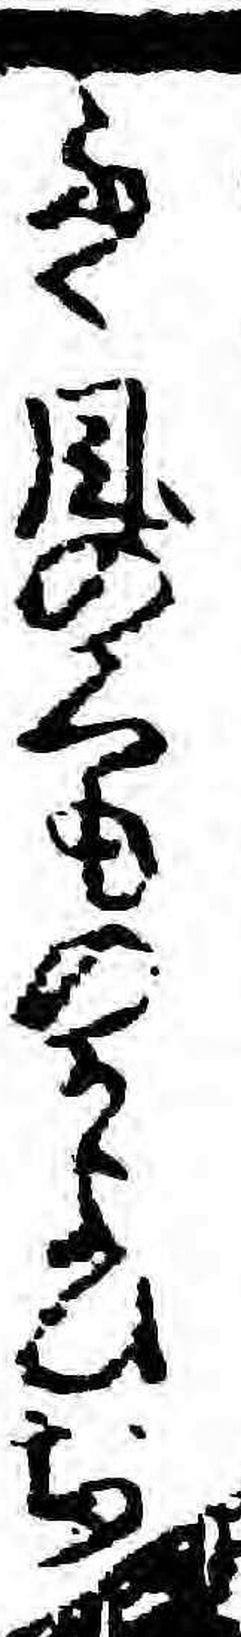ふく風のくものかよひぢ
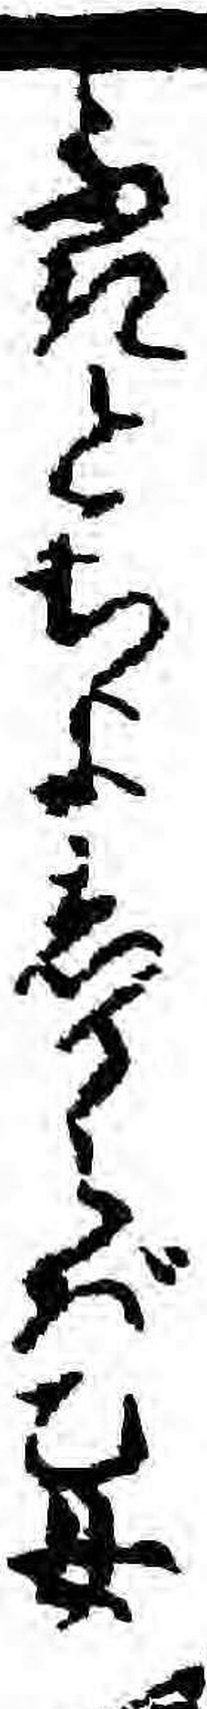ふきとちよしからば乙女
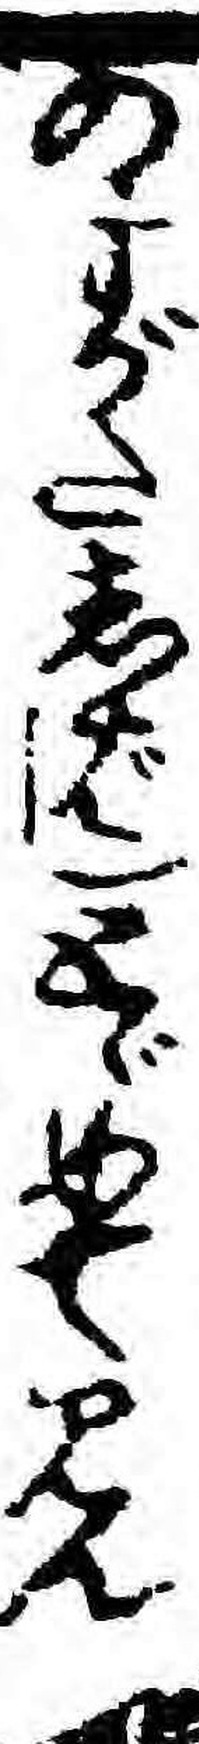のすがたしばしとどめて見ん
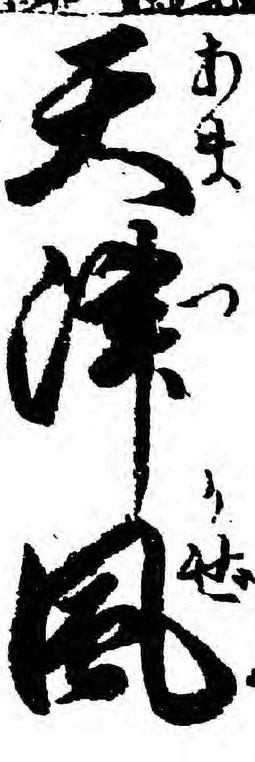天津風
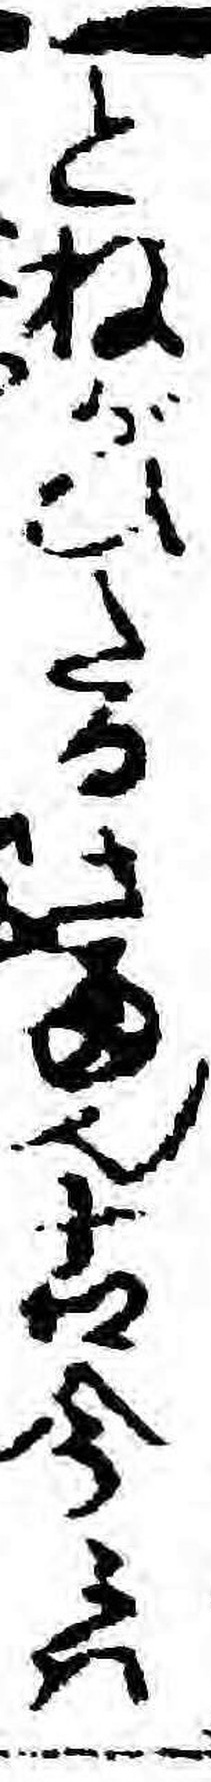とねがひたるさま也古今には
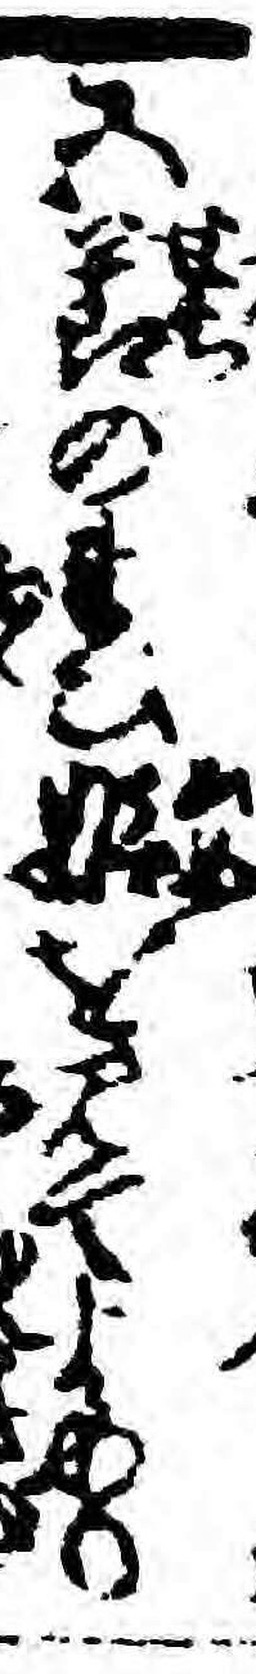五節のまひ姫を見てよめり
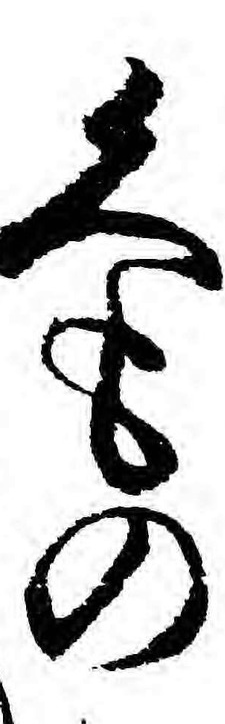くもの
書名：頭書和歌注譯／壽賀多百人一首小倉錦
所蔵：国文学研究資料館
